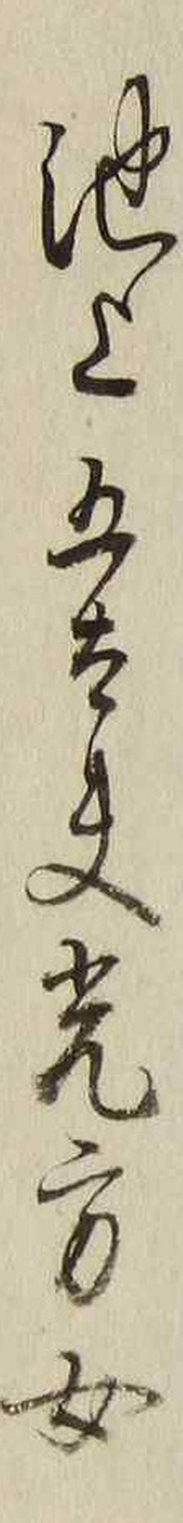池上五太夫光方女

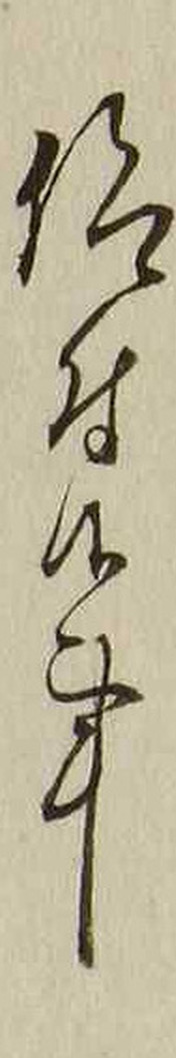仰付候事
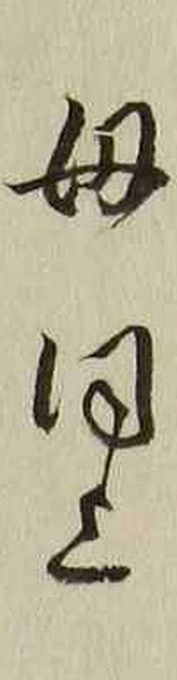母同上
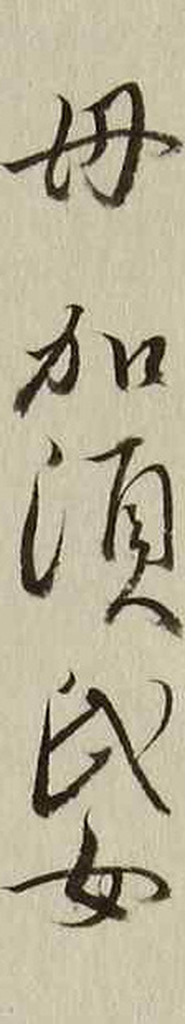母加須氏女
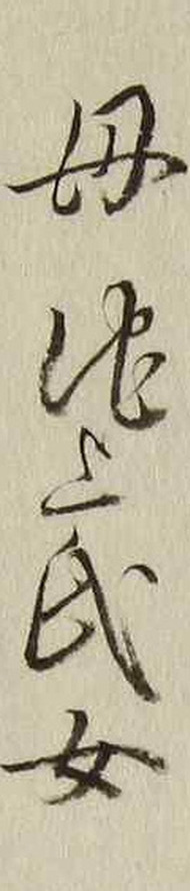母池上氏女
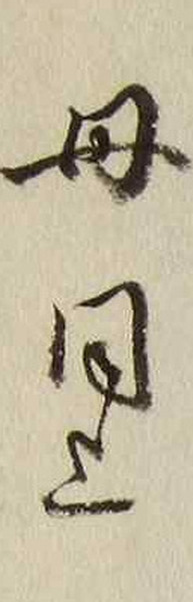母同上

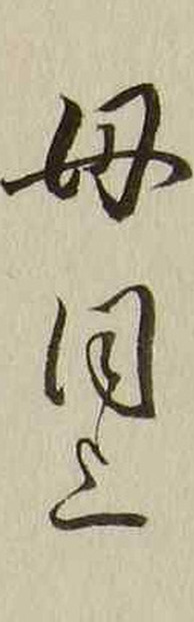母同上
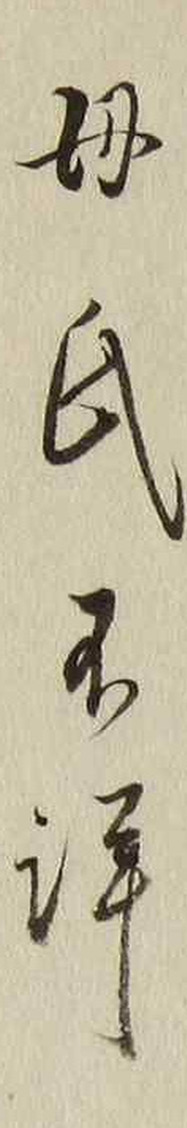母氏不詳
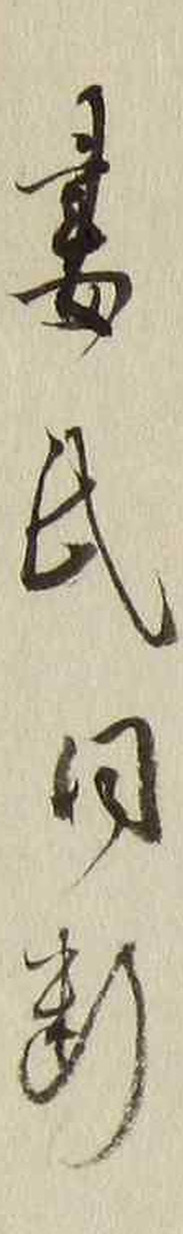妻氏同断
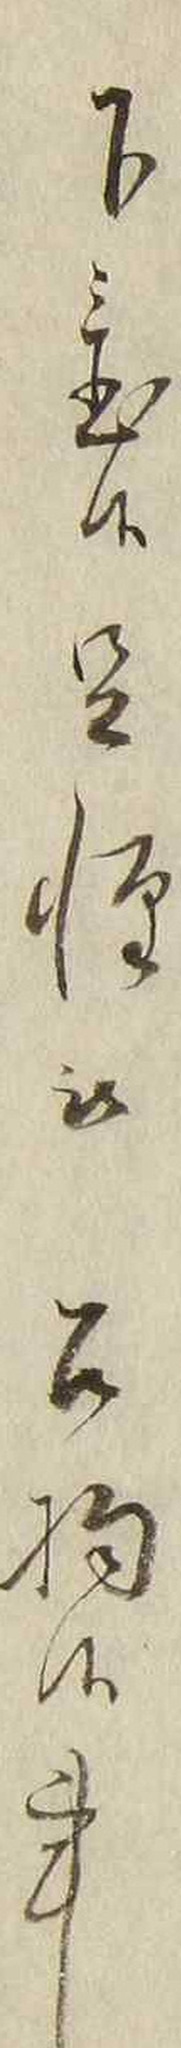下置候足軽被召抱候事

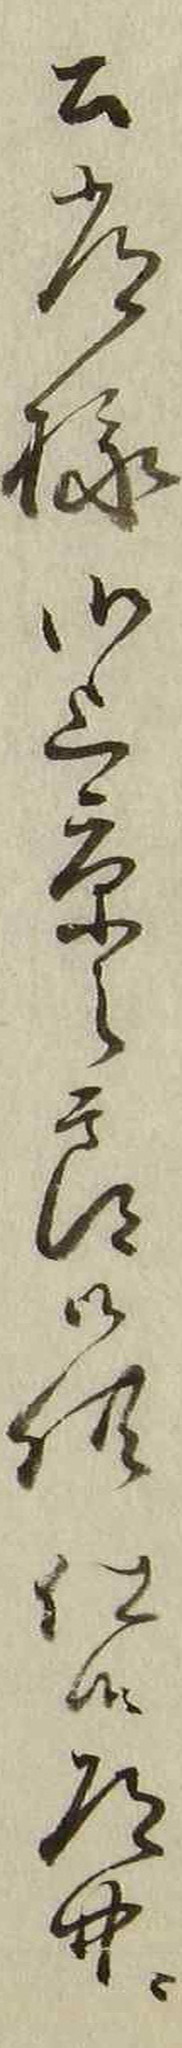云常様御上京之節御供仕候道中ニ
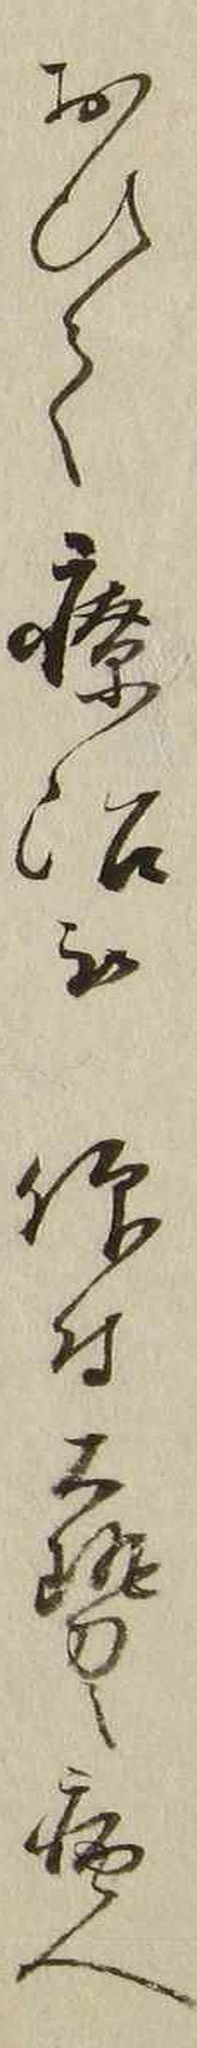おひて療治被仰付大勢之病人
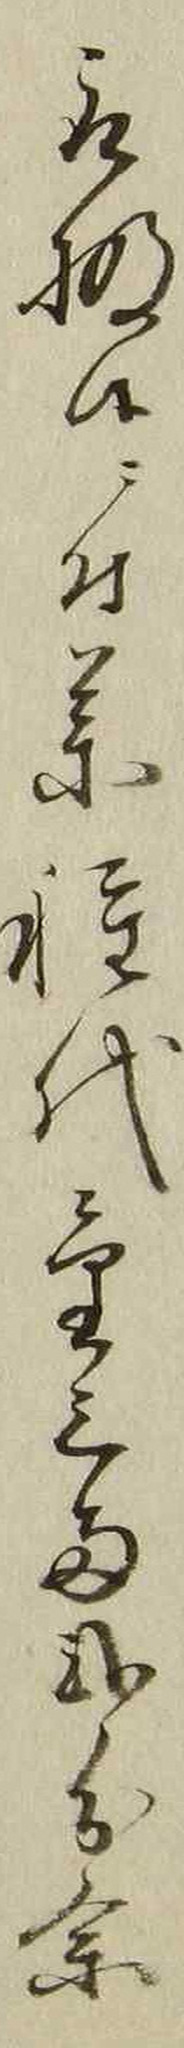取扱候ニ付薬種代金三両弐分余
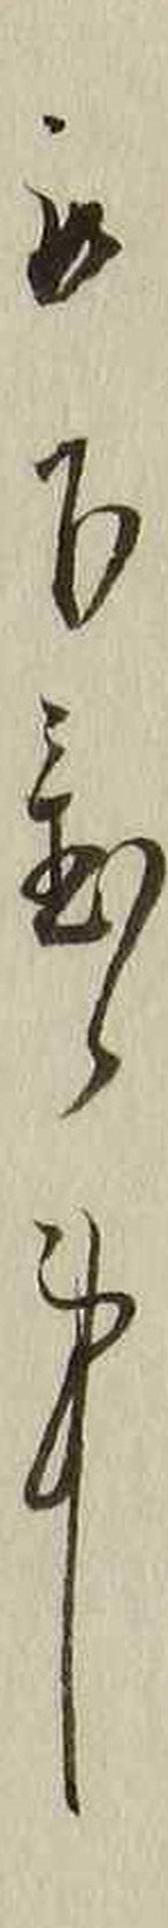被下置候事
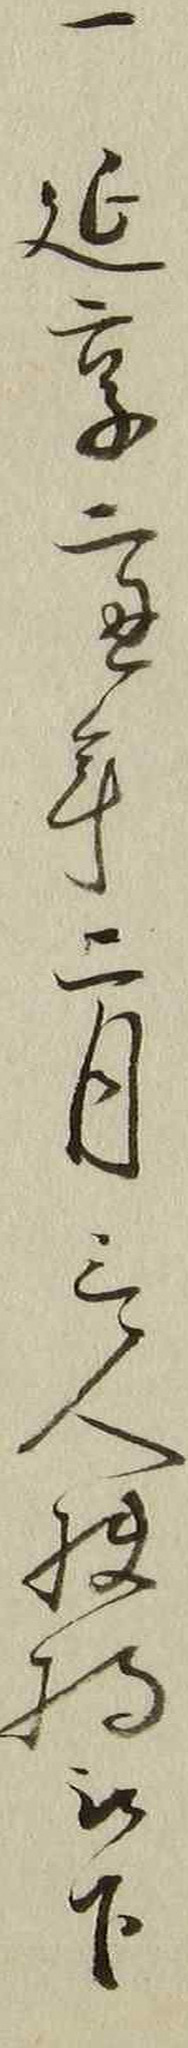一延享二丑年二月三人扶持被下
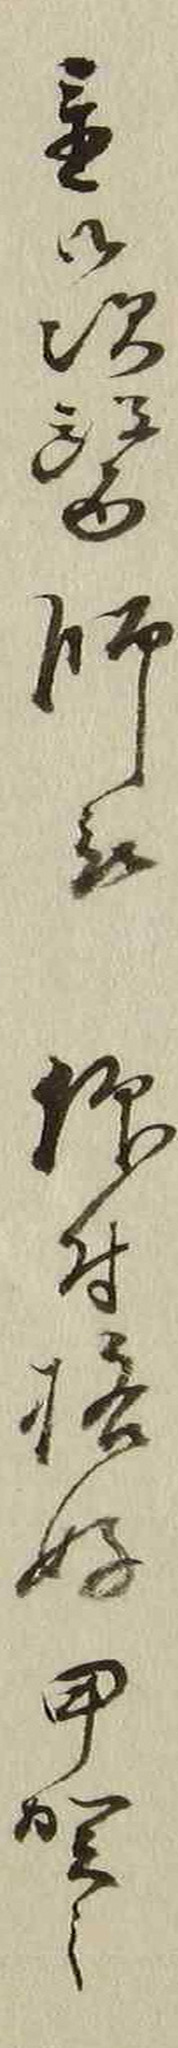置御次医師被仰付格好甲賀之
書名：諸士系譜　巻之129　た之部5
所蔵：会津若松市立会津図書館
